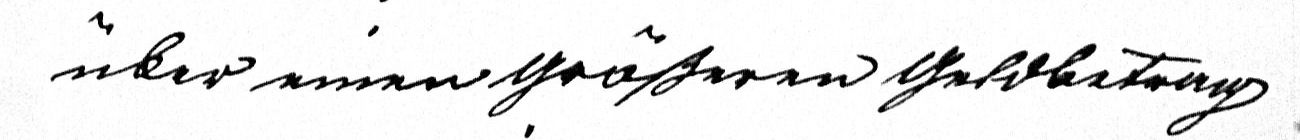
über einen größeren Geldbetrag
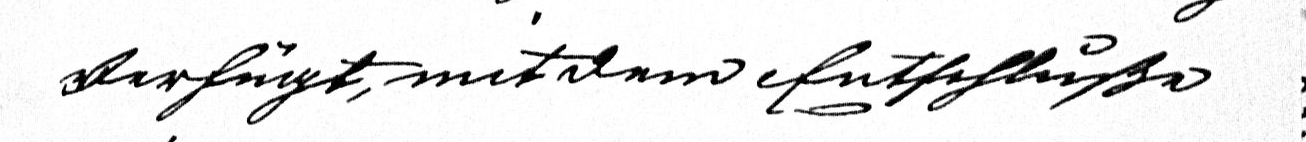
Verfügt, mit dem Entschluße
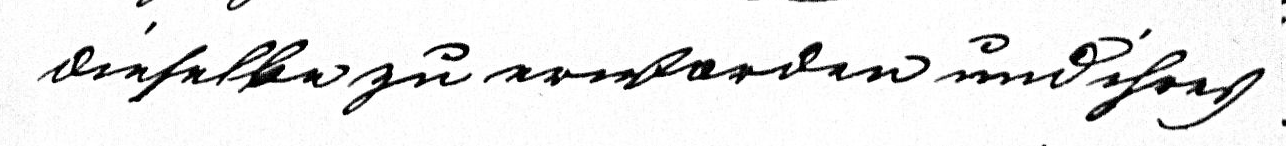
dieselbe zu erworden und ihres
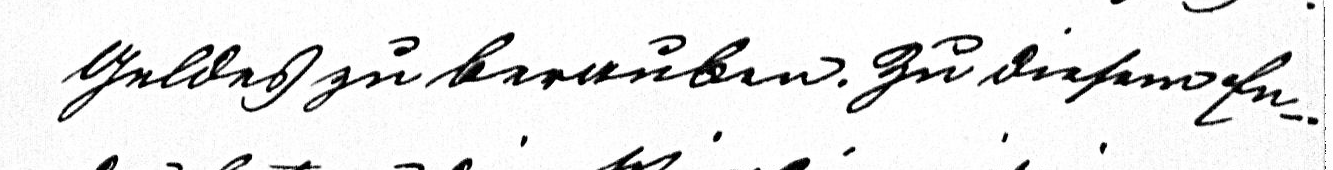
Geldes zu berauben. Zu diesem En¬
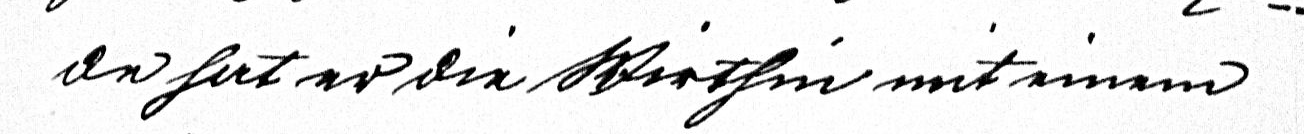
de hat er die Wirthin mit einem
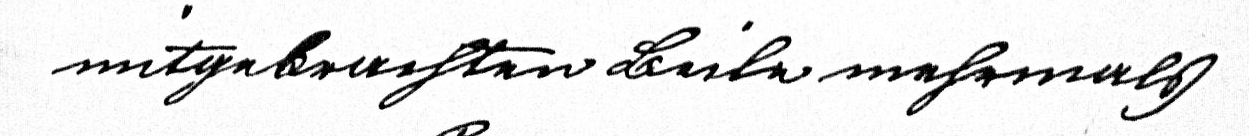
mitgebrachten Beile mehrmals
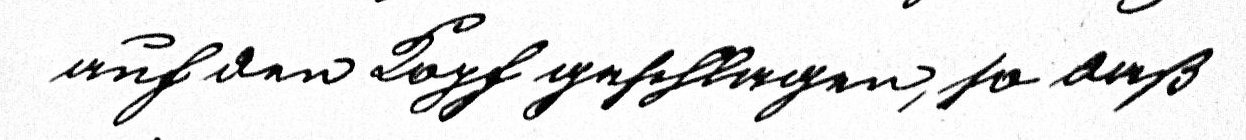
auf den Kopf geschlagen, so auß
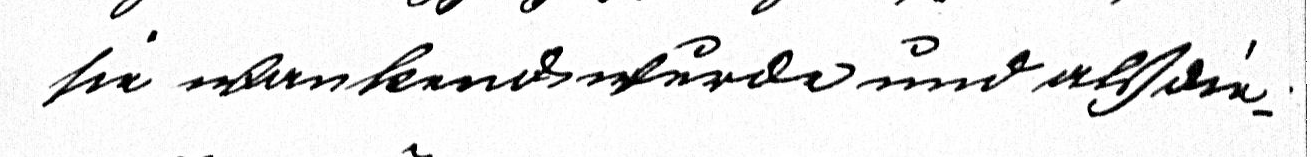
sie wankend wurde und als die¬
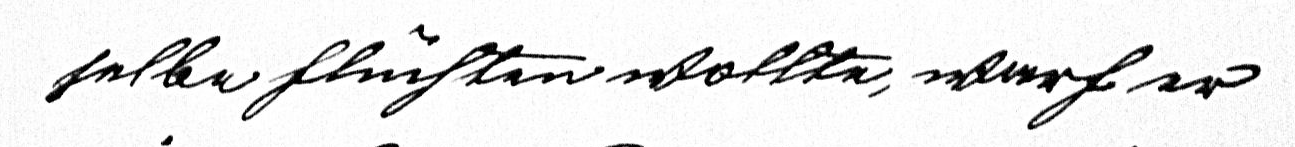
selbe flüchten wollte, warf er
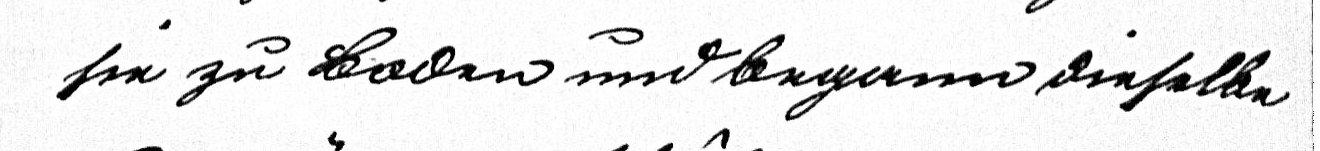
sie zu Boden und begann dieselbe
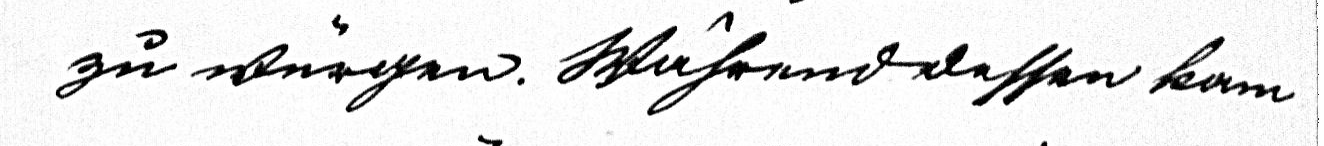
zu würgen. Wahrend dessen kam
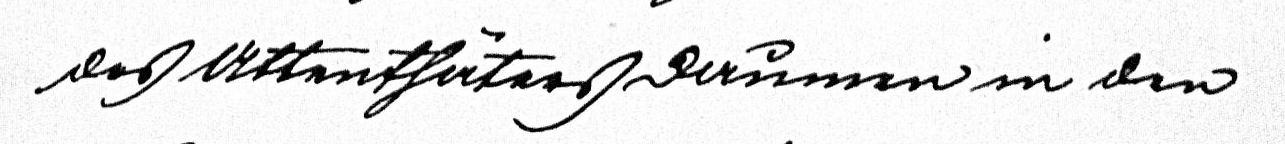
des Attenthäters Daumen in den
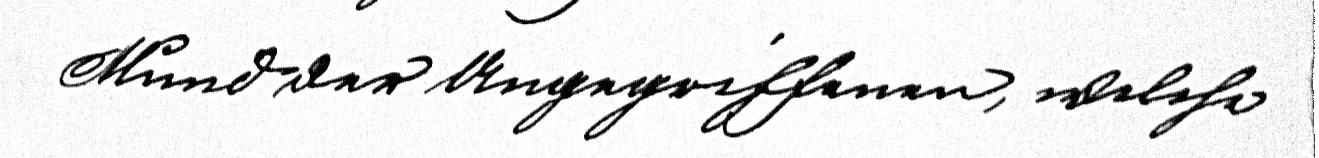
Mund der Angegriffenen, welche
